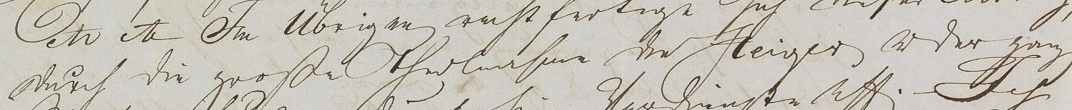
durch die große Theilnahme die Steiger in der ganzen
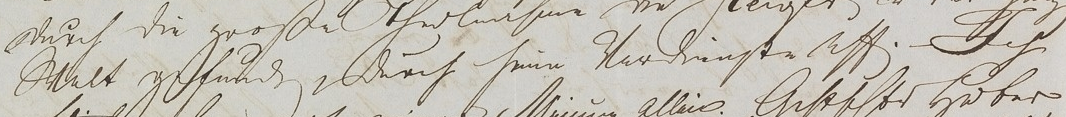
Welt gefunden, durch seine Verdienste usf. – Ich
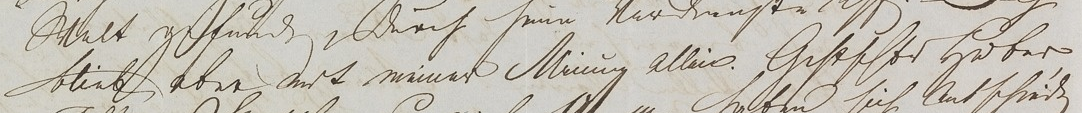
blieb aber mit meiner Meinung allein. Gchtschbr Huber,
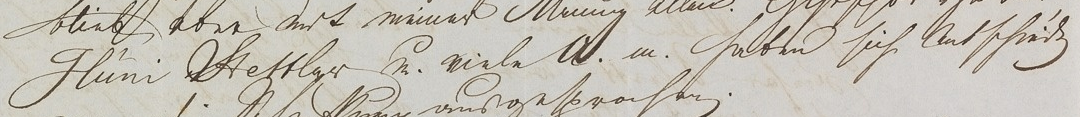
Hüni-Stettler u. viele A. m. haben sich entschieden
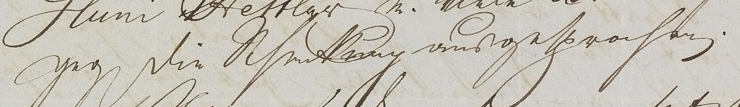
gegen die Schenkung ausgesprochen.
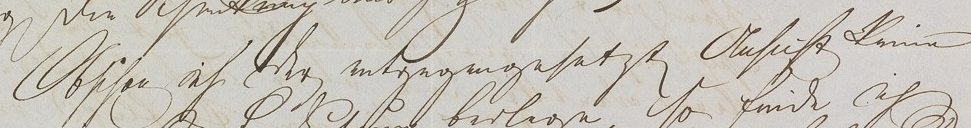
Obschon ich der entgegengesetzten Ansicht keine
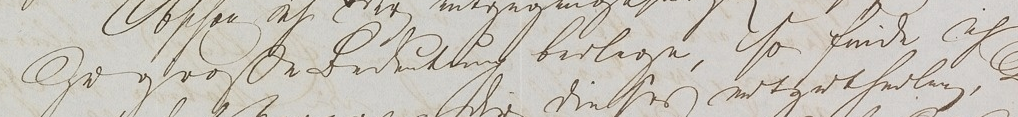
zu große Bedeutung beilege, so finde ich
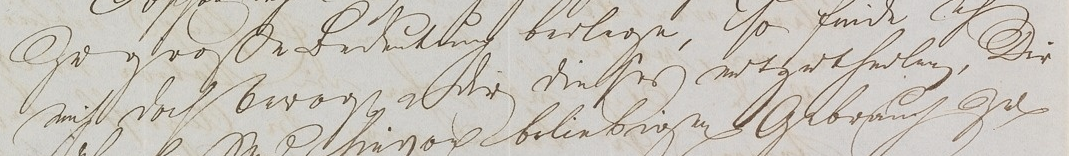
mich doch bewogen, dir dieses mitzutheilen, dir
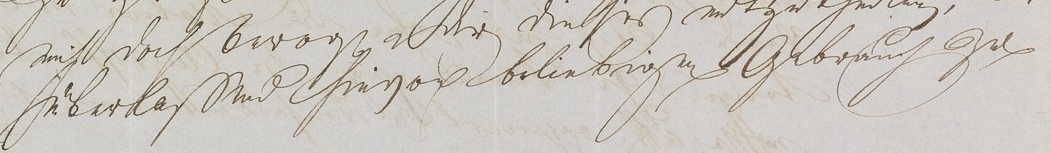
überlaßend hievon beliebigen Gebrauch zu
